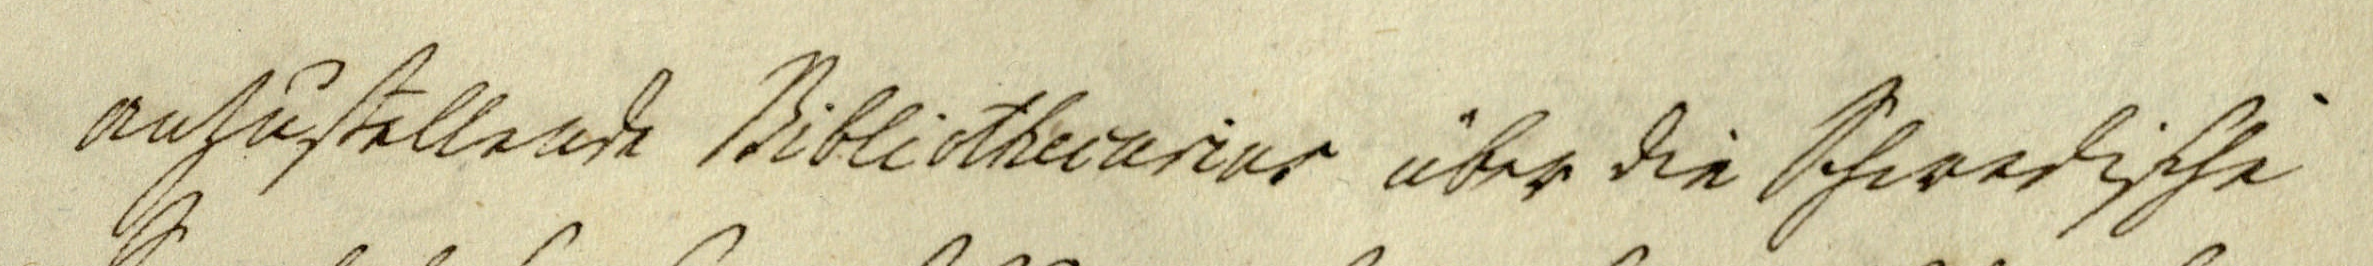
anzustellende Bibliothecarius über die Schwedische
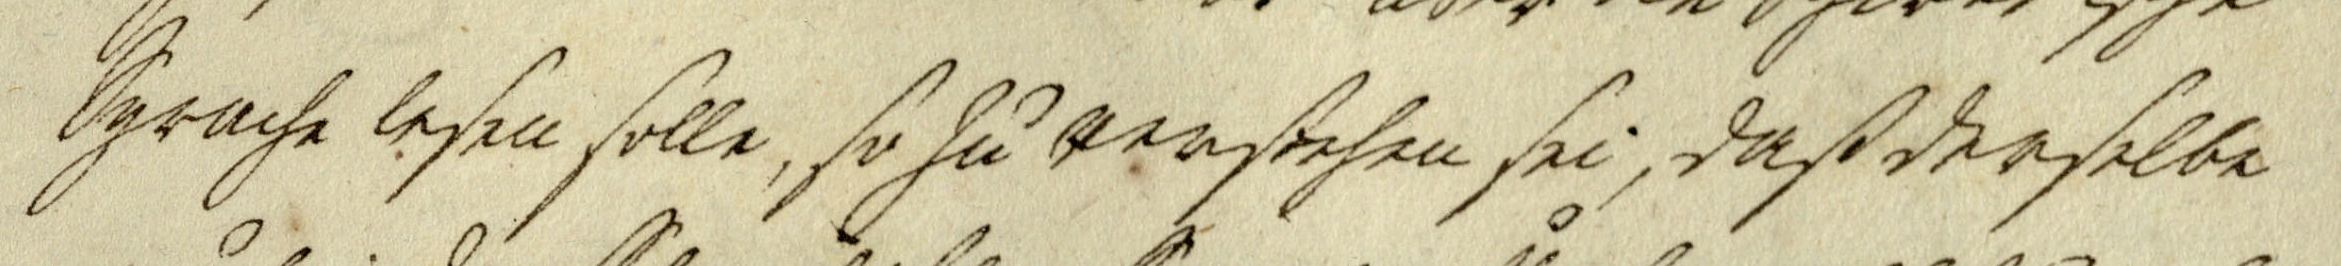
Sprache lesen solle, so zu versehen sei, daß derselbe
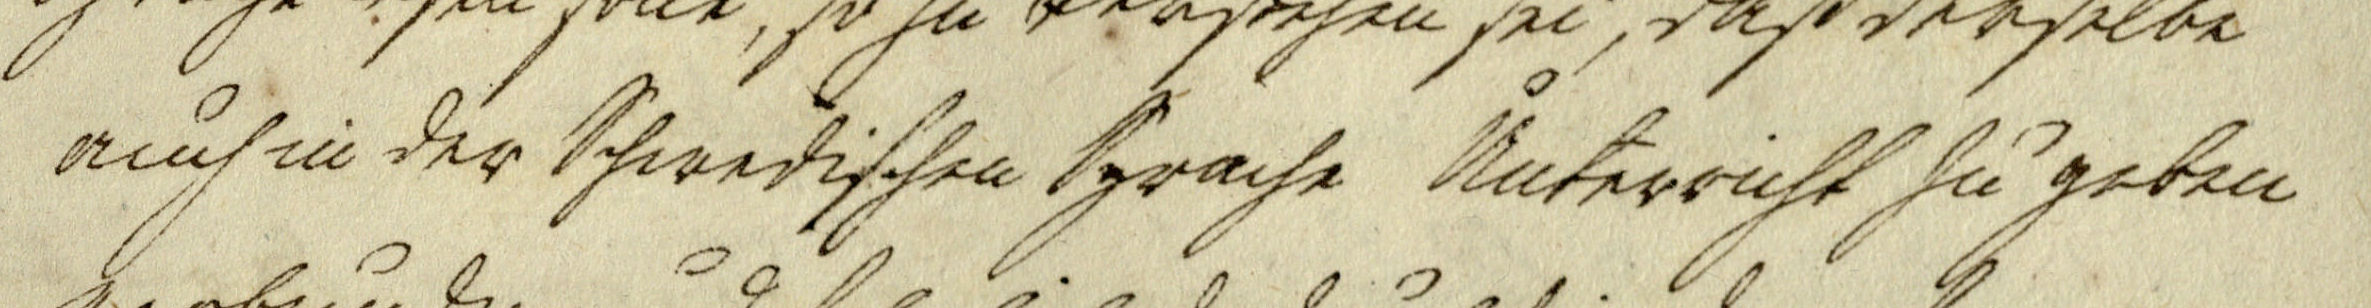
auch in der Schwedischen Sprache Unterricht zu geben
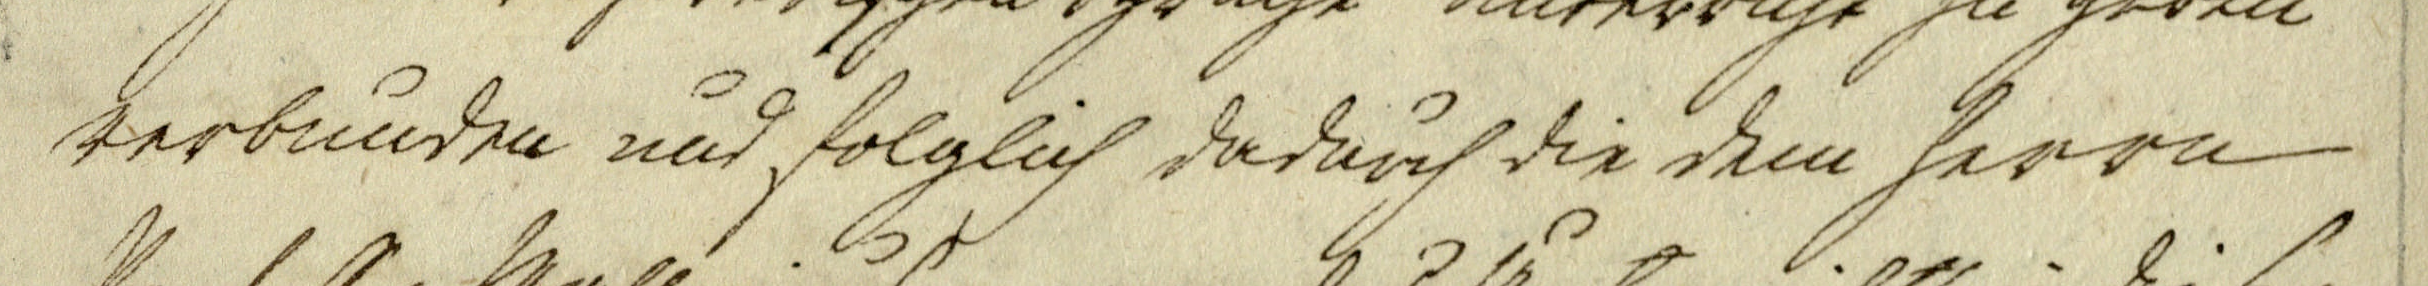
verbunden und folglich dadurch die dem Herrn
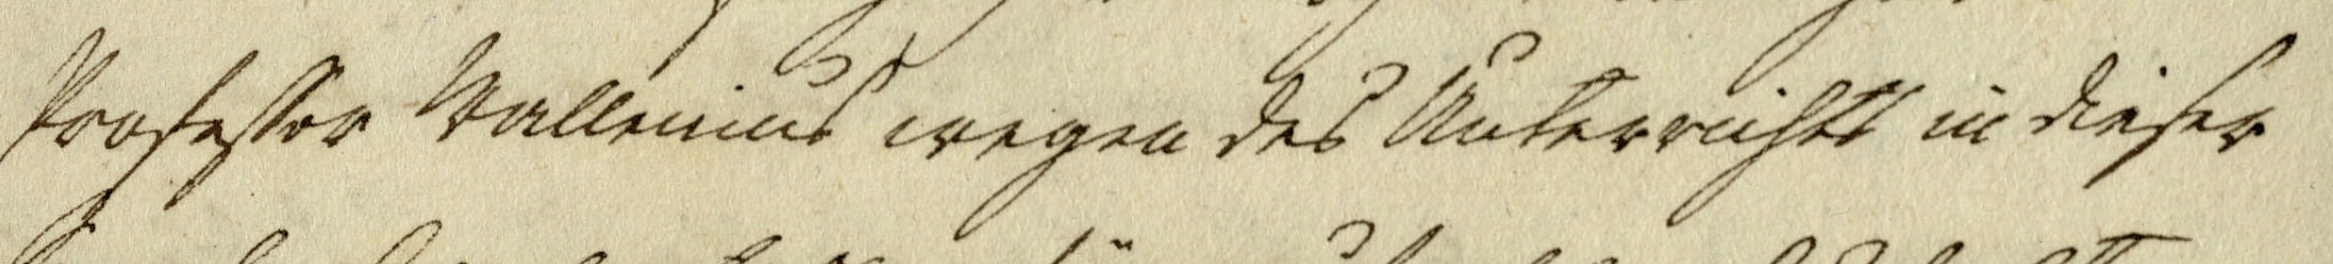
Professor Wallenius wegen des Unterrichts in dieser
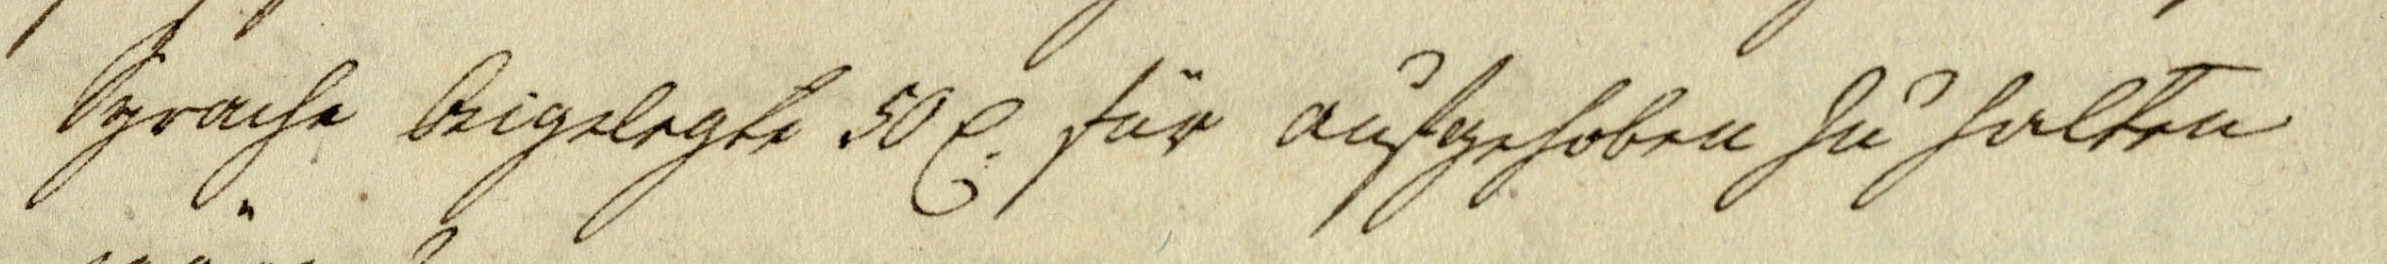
Sprache beigelegte 50 l. für aufgehoben zu halten
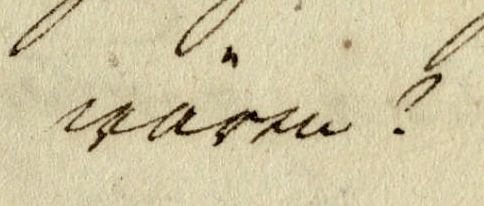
wären?
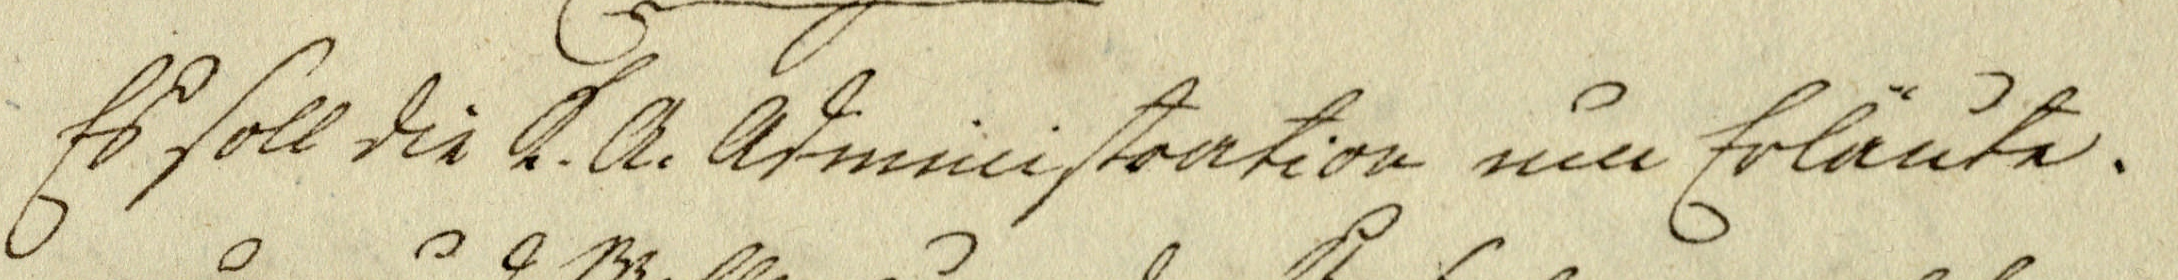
Es soll die K. A. Administration um Erläute¬
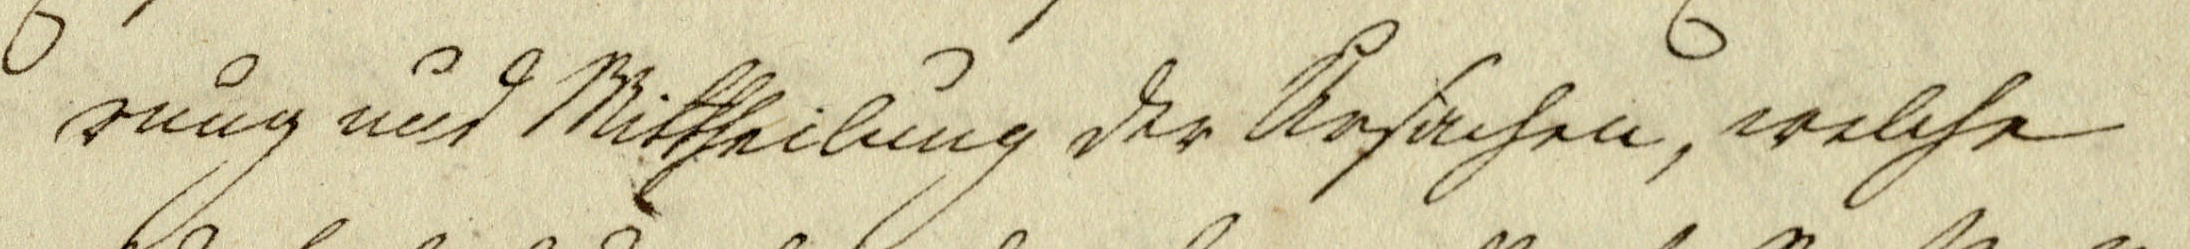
rung und Mittheilung der Ursachen, welche
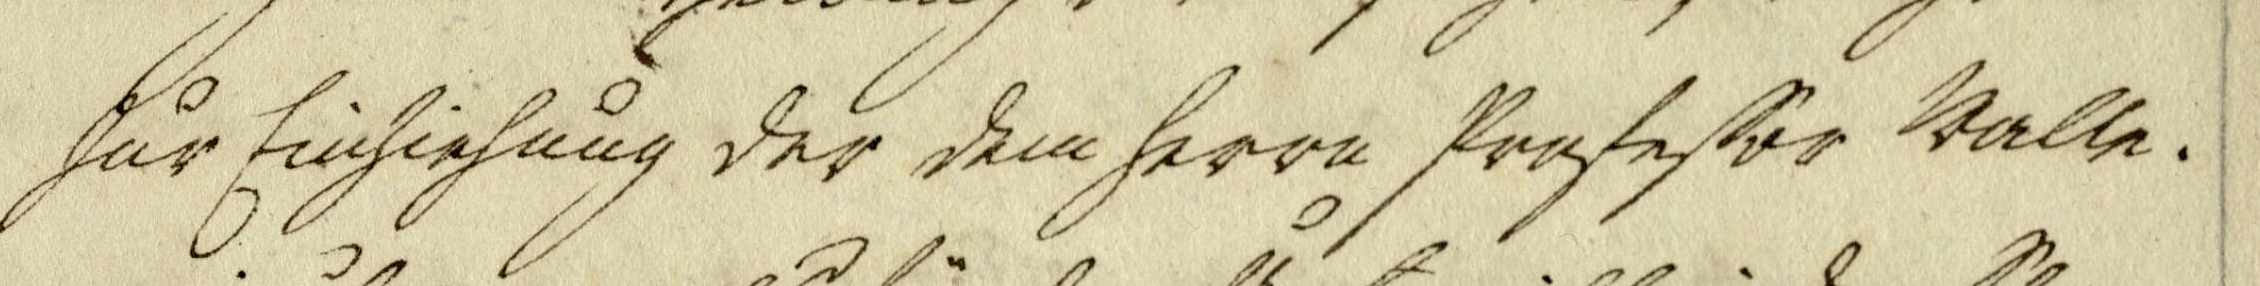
zur Einziehung der dem Herrn Professor Walle¬
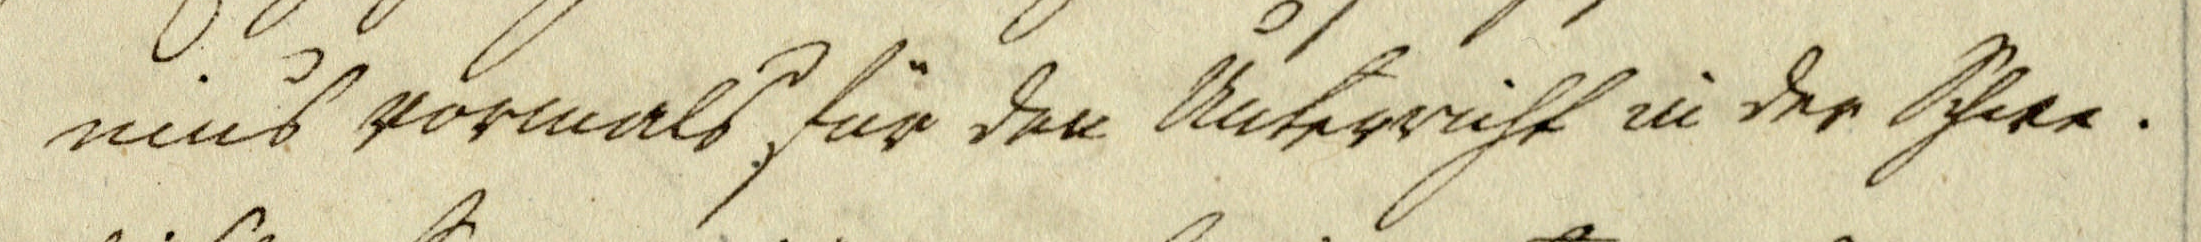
nius vormals für den Unterricht in der Schwe¬
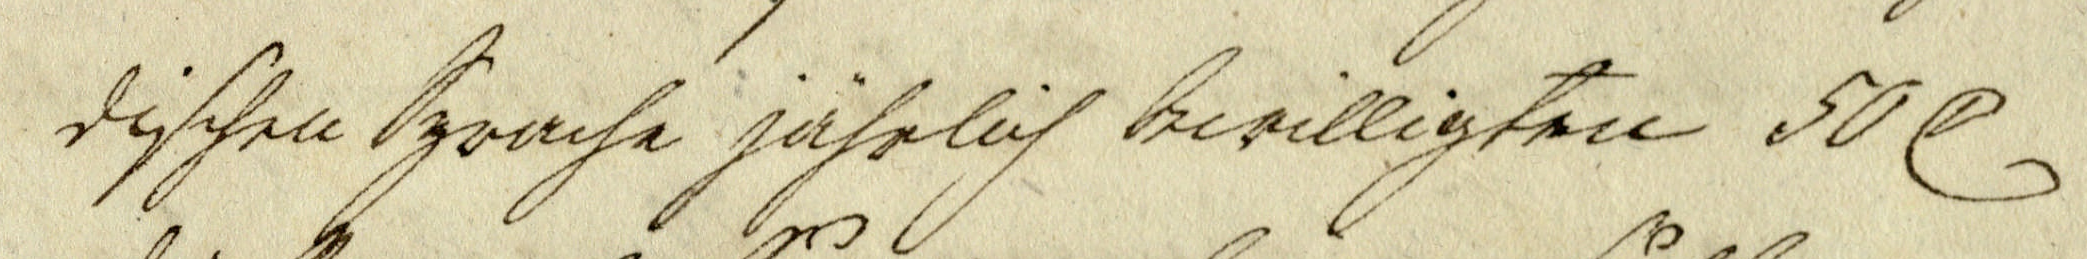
dischen Sprache jährlich bewilligten 50 l.
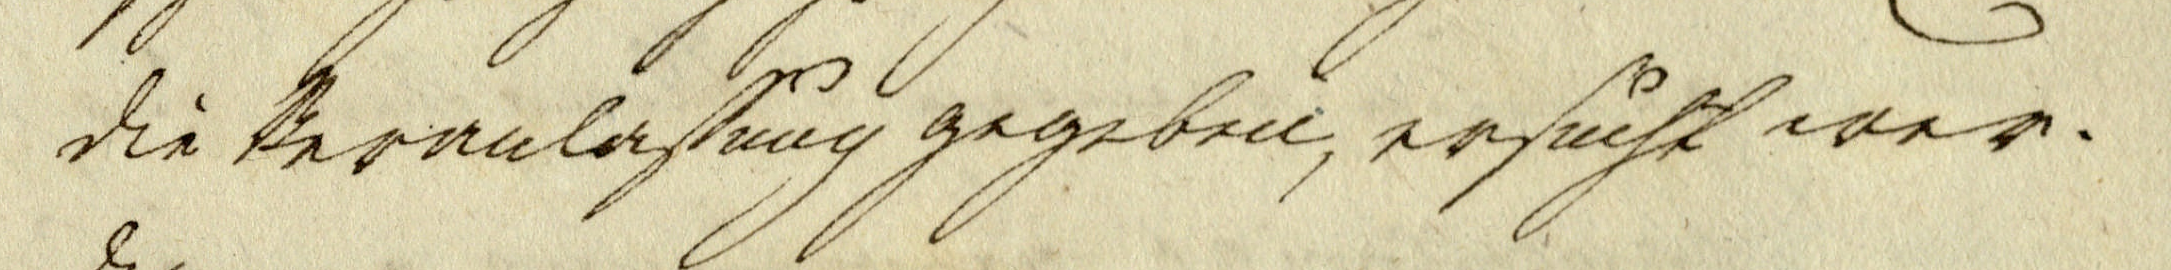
die Veranlassung gegeben, ersucht wer¬
